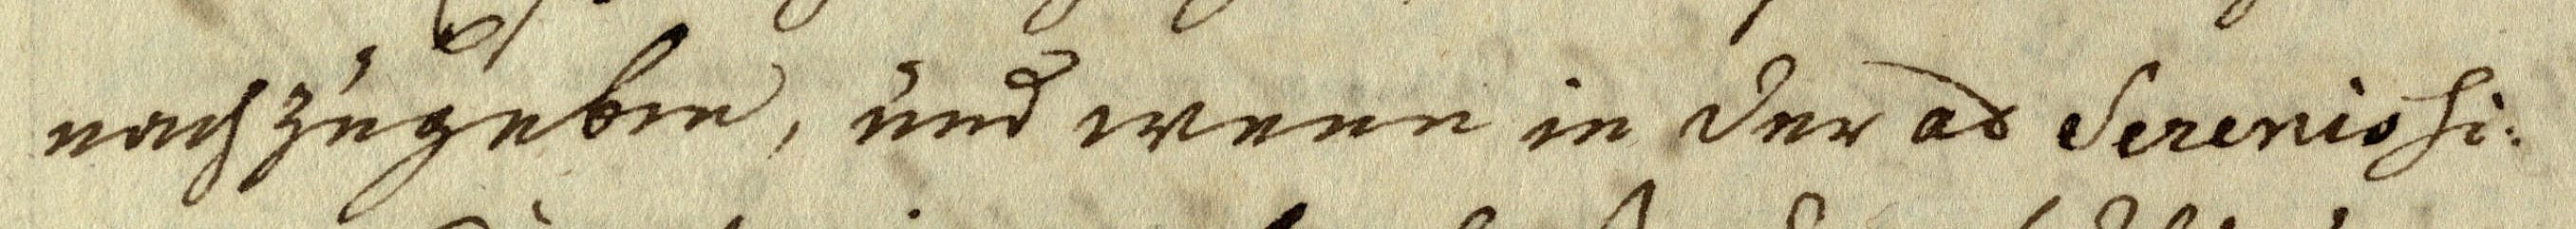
nach zugeben, und wenn in der ad Serenissi¬
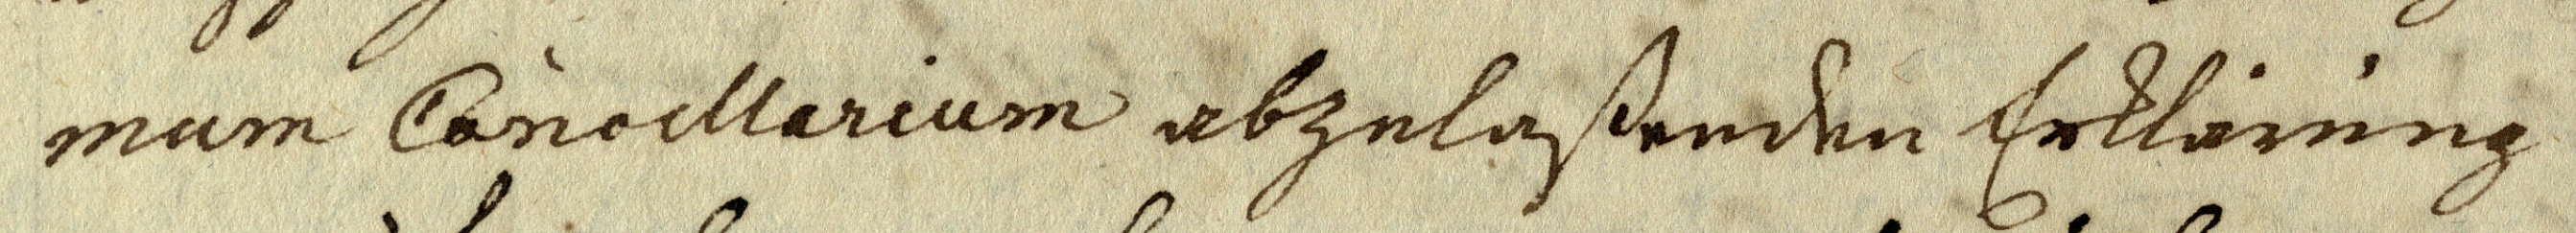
mum Cancellarium abzulaßenden Erklärung
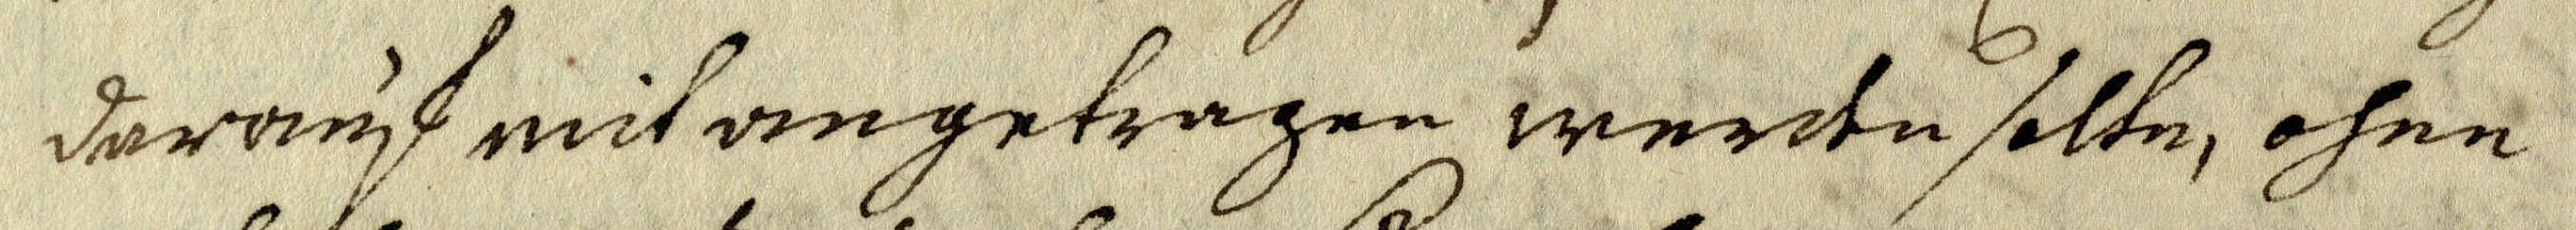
darauf mit angetragen werden solte, ohne
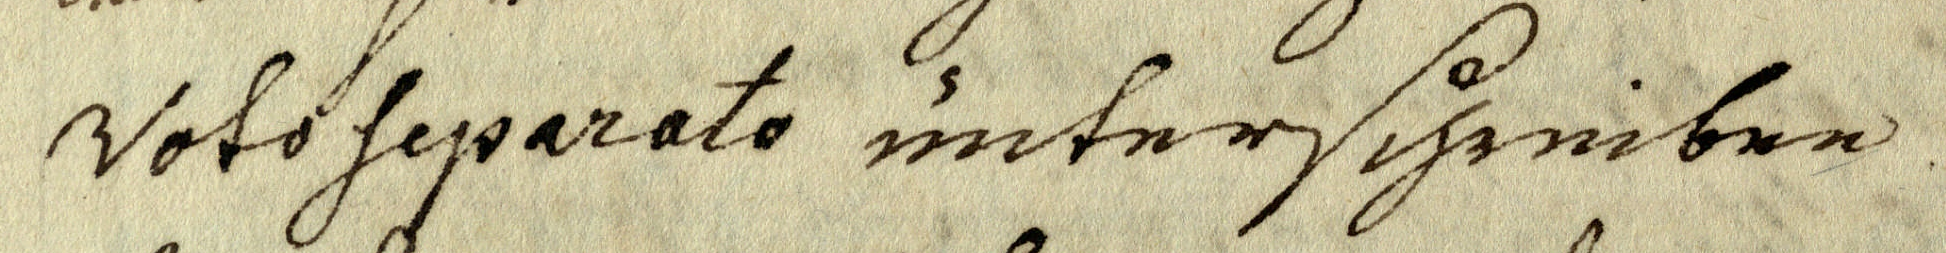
Voto separato unterschreiben.
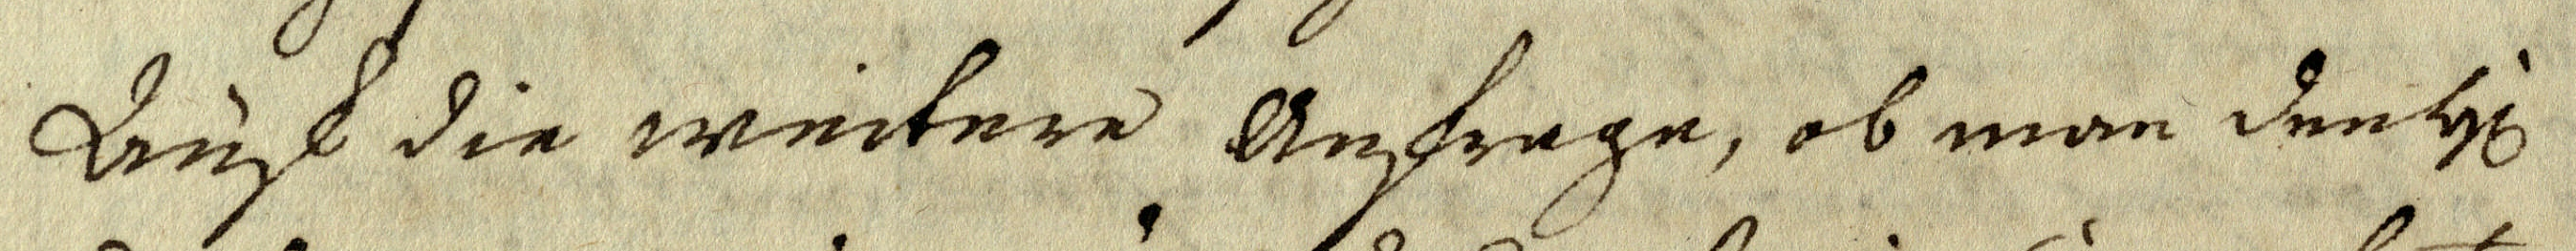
Auf die weitere Anfrage, ob man dem H
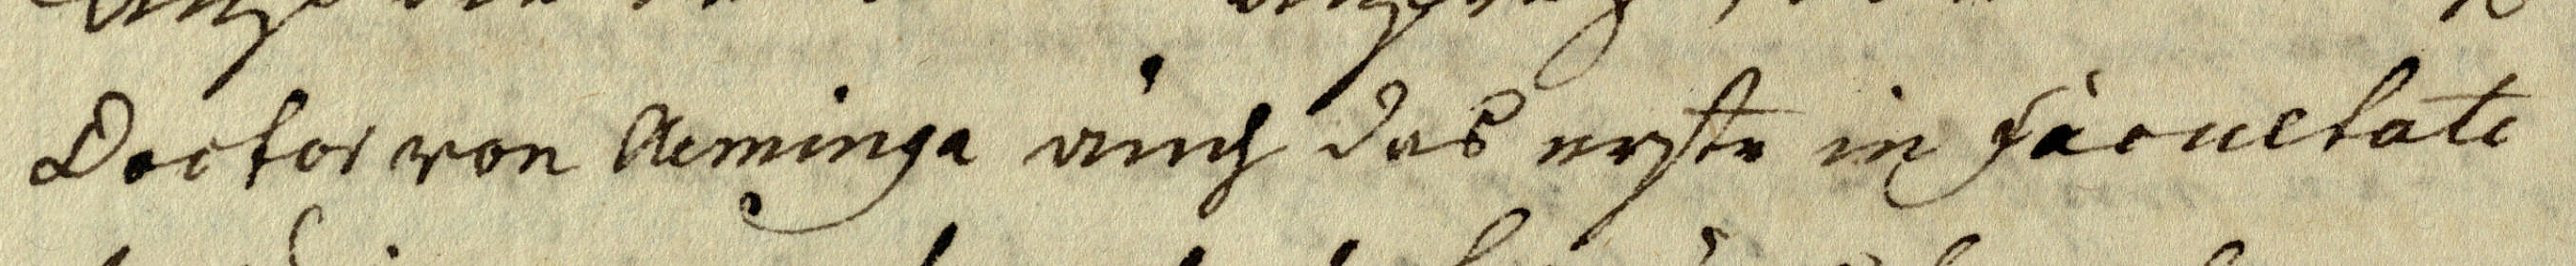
Doctor von Aeminga auch das erste in Facultate
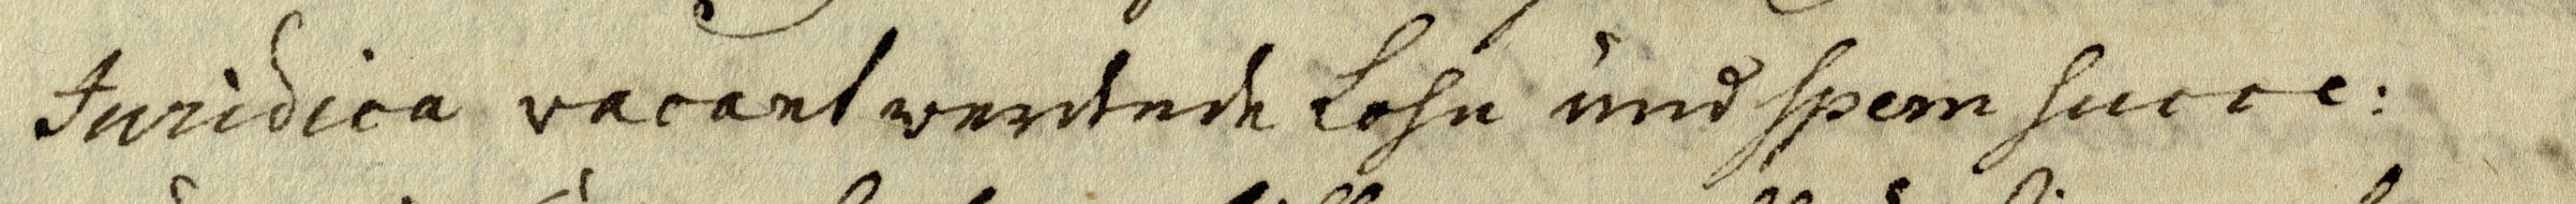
Juridica vacant werdendeLohn und Spem succe¬
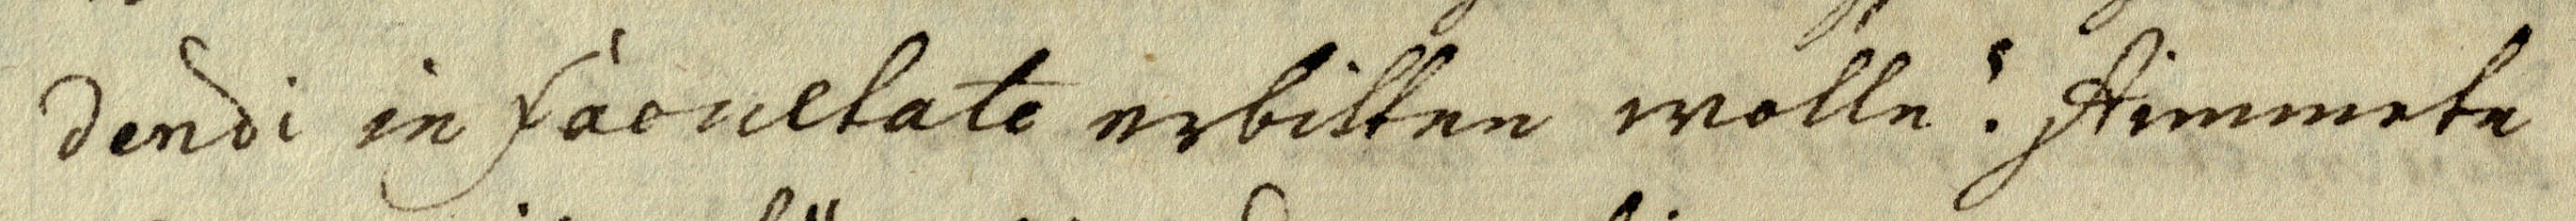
dendi in Facultate erbitten wolle? stimmte
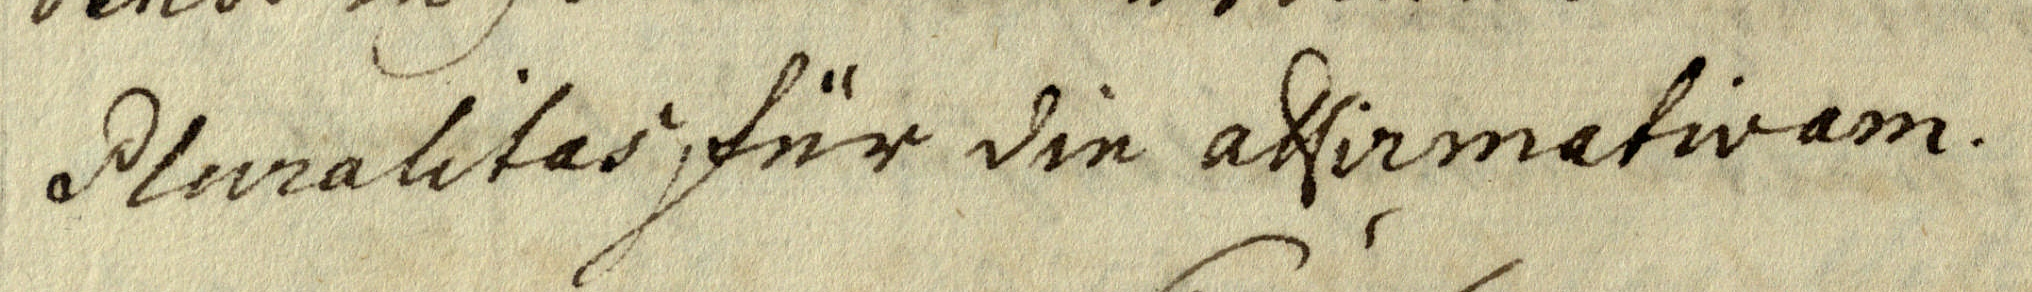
Pluralitas für die assirmativam.
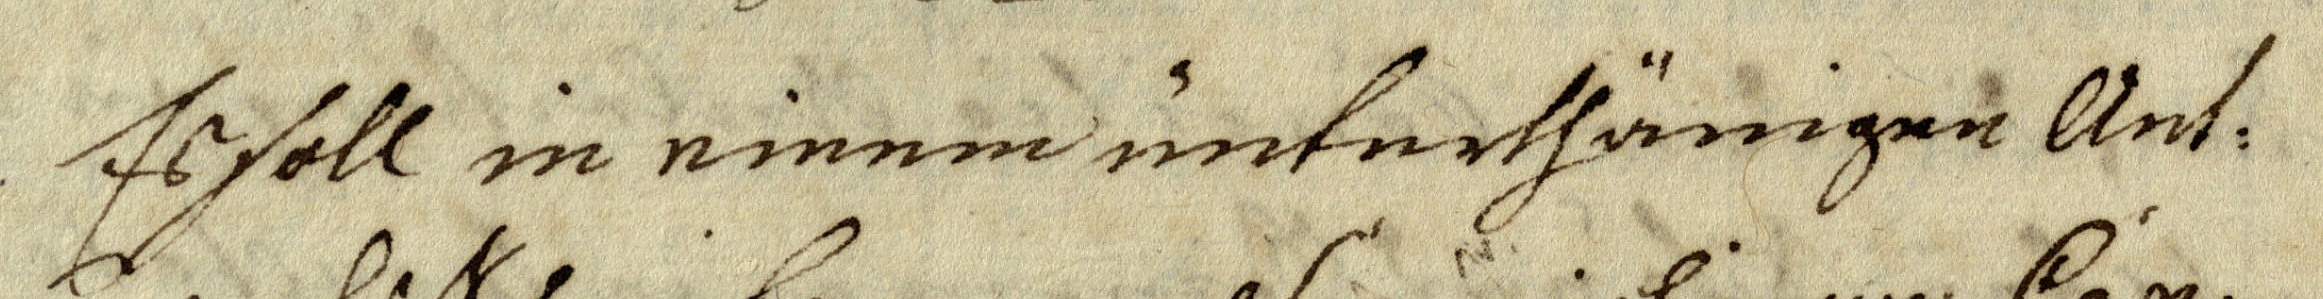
Es soll in einem unterthänigen Ant¬
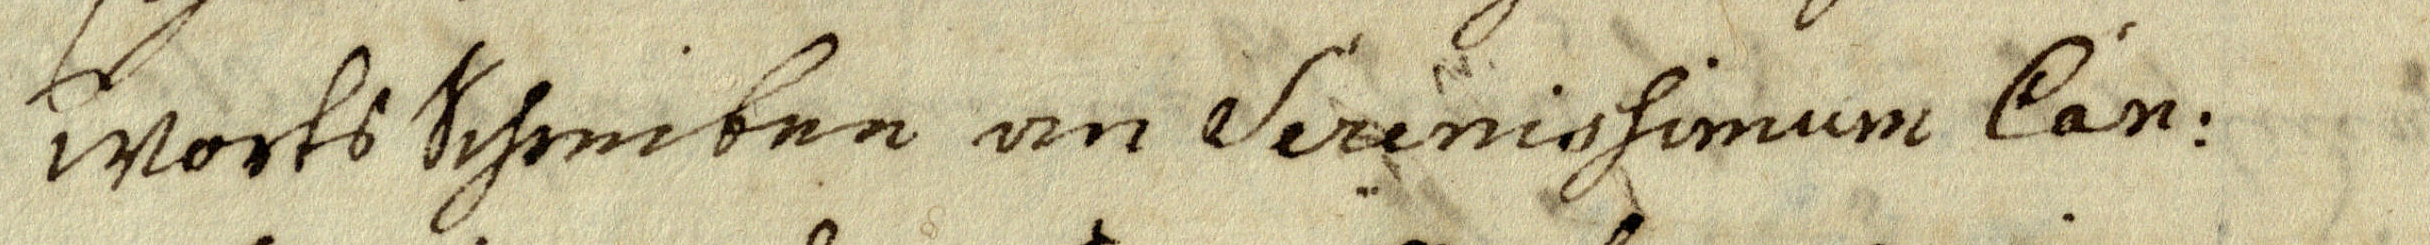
worts Schreiben an Serenissimum Can¬
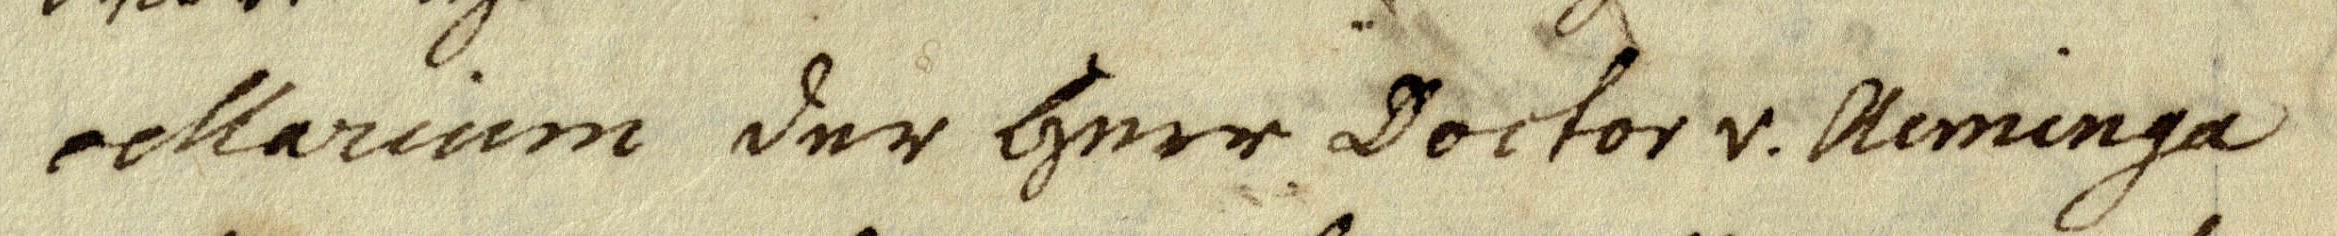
cellarium der Herr Doctor v. Aeminga
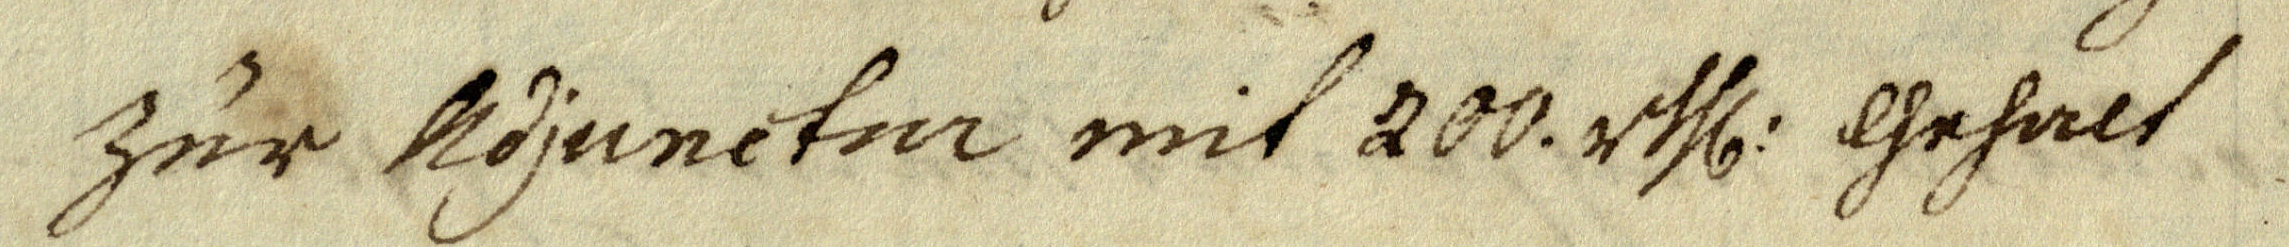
zur Adjunctur mit 200 rtl. Gehalt
